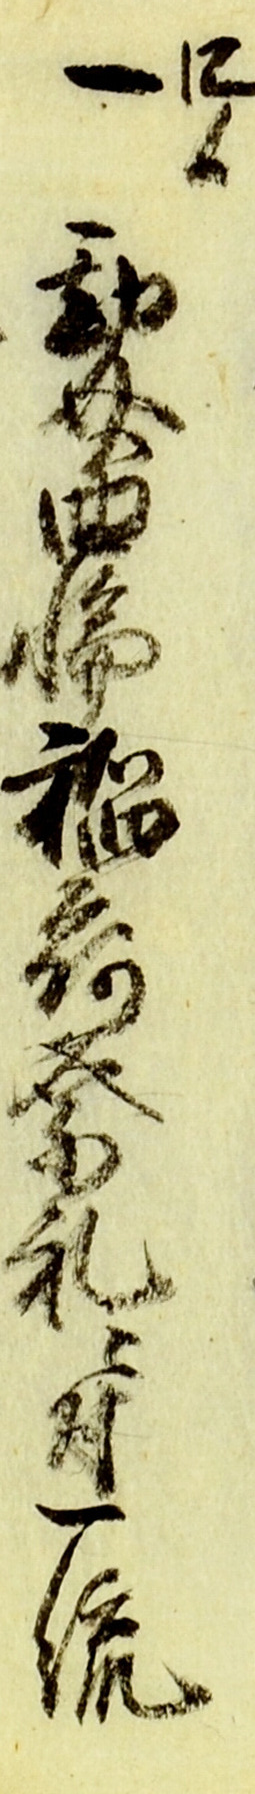一勘介曲輪稲荷祭礼ニ付一統
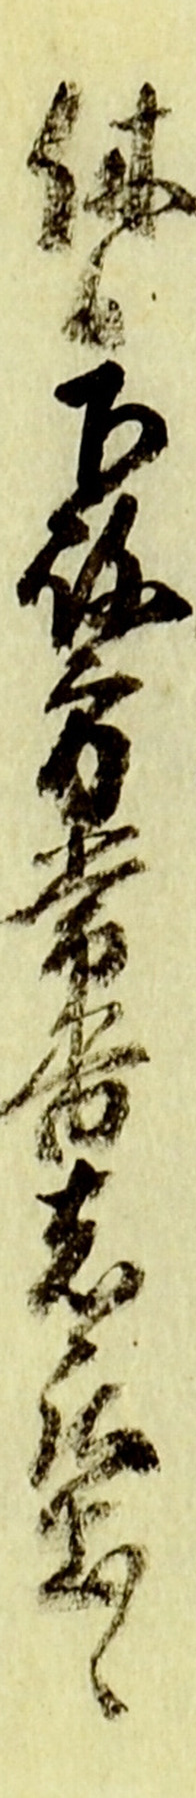休候下役方常番者罷出候
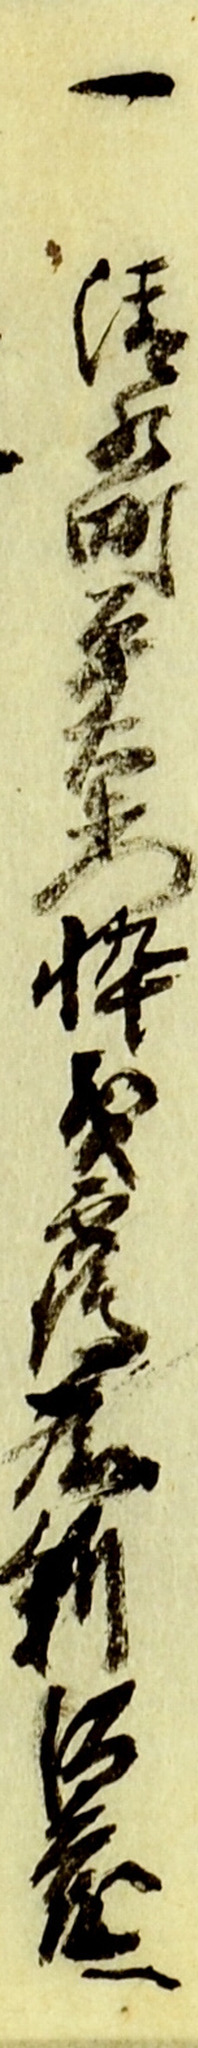一清水町平右衛門倅儀鶴屋新酒蔵へ
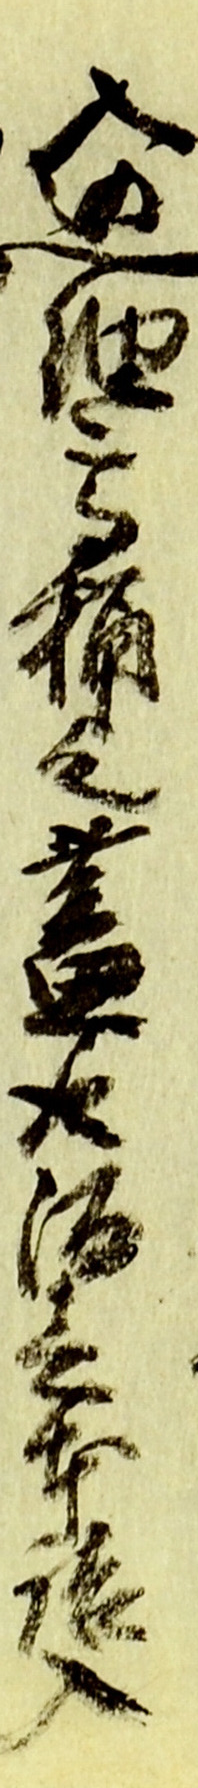入込細高桶也蓋取酒壱本詰入
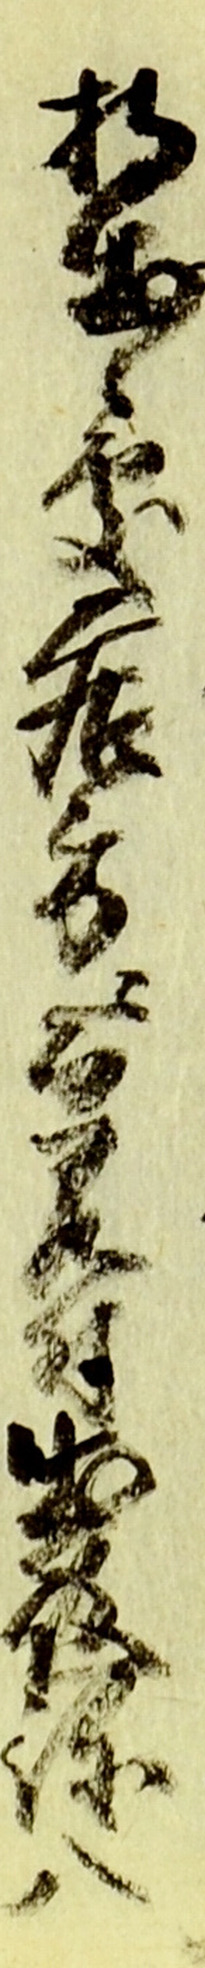持出候処店方ニ而見付出役弥八
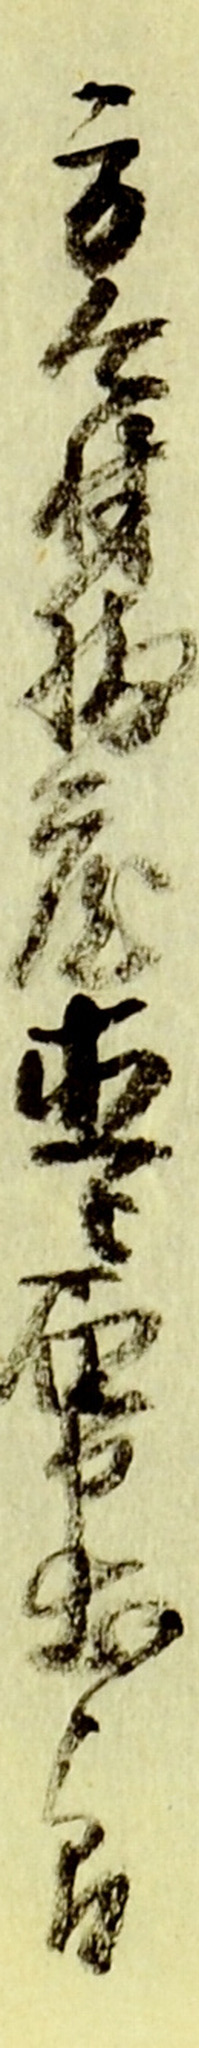方今村勝蔵直ニ届申出候間
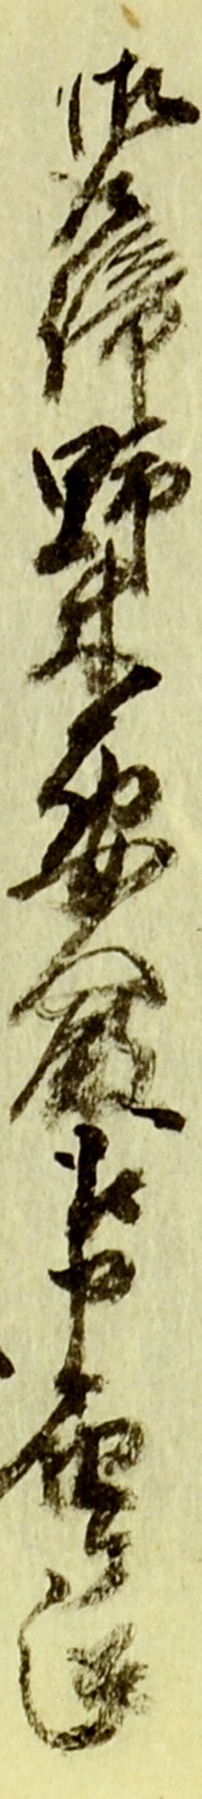御取締野木要人殿江申届ケ趣
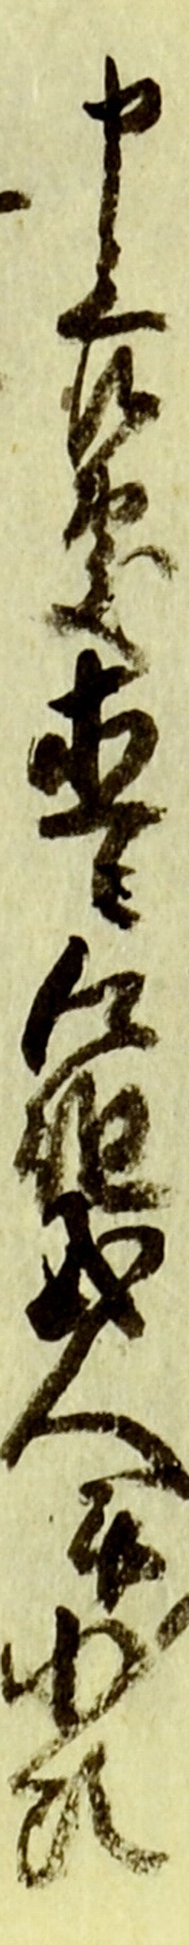申上候処直ニ郷組弐人幷小頭
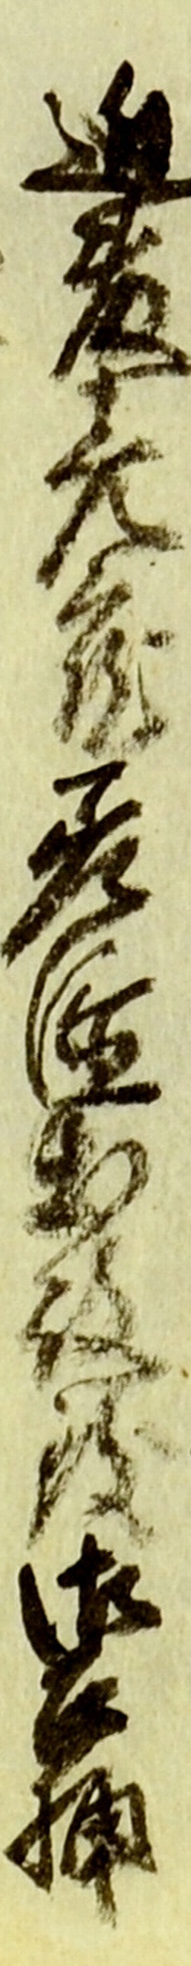近藤彦蔵差添出役致御召捕
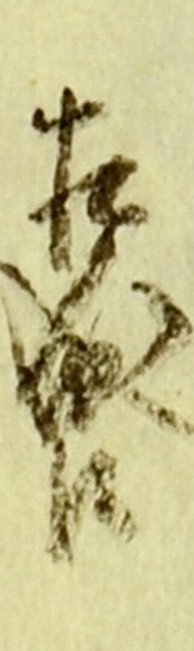相成候
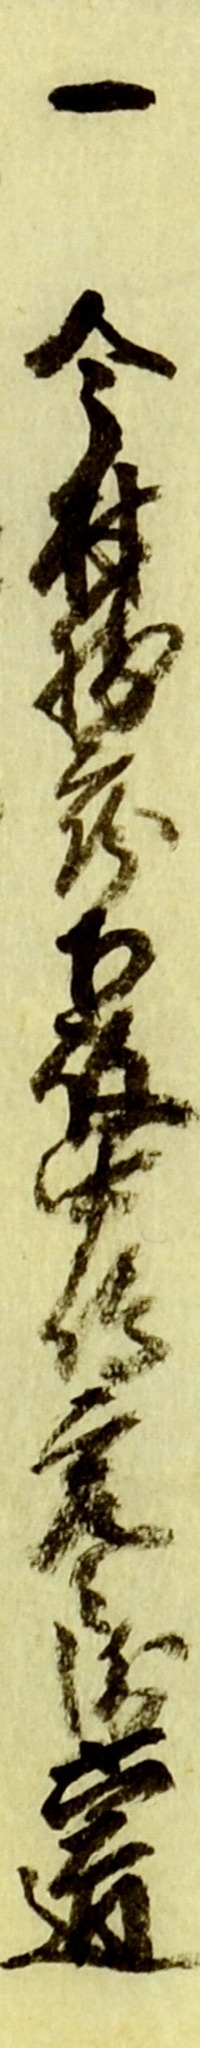一今村勝蔵下役中嶋覚兵衛六道
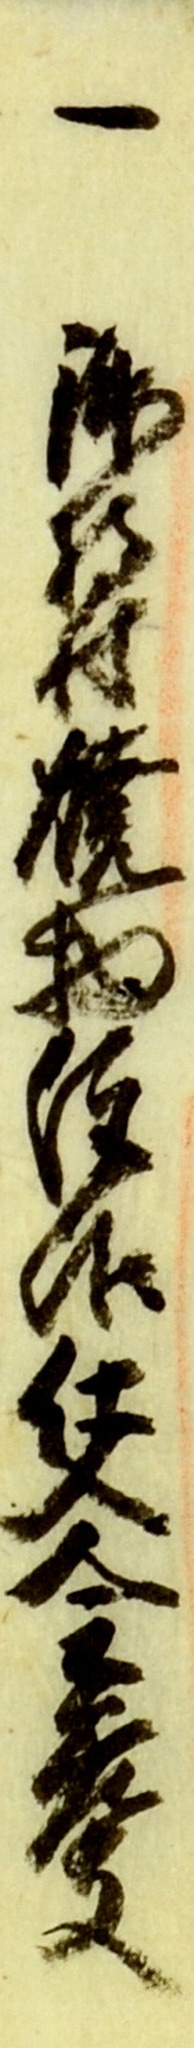一鉾持村焼物作治仕入金差支
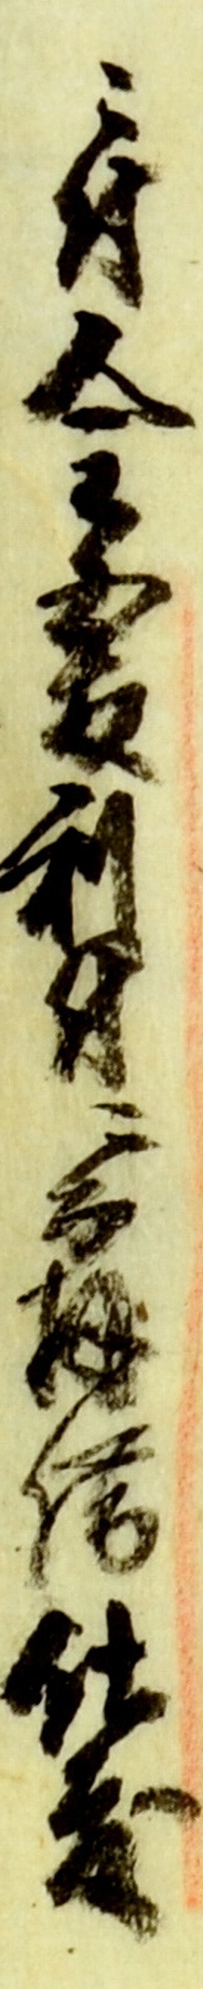ニ付金五両利付ニ而拝借仕度
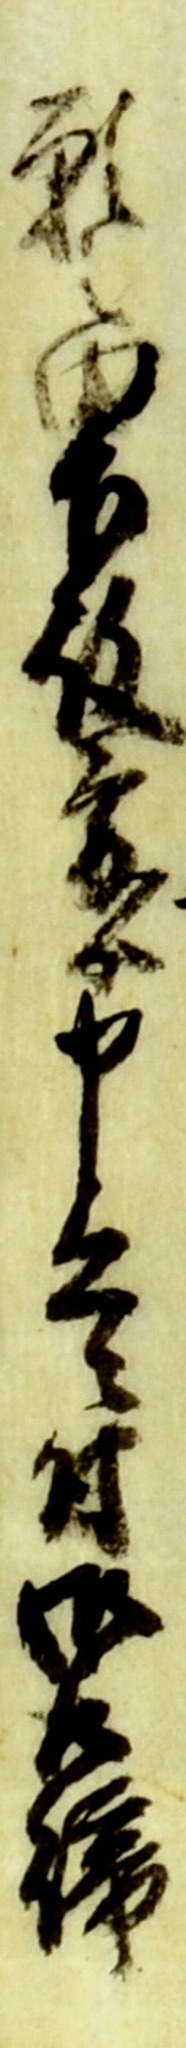願之由下役方ゟ申立ニ付御取締

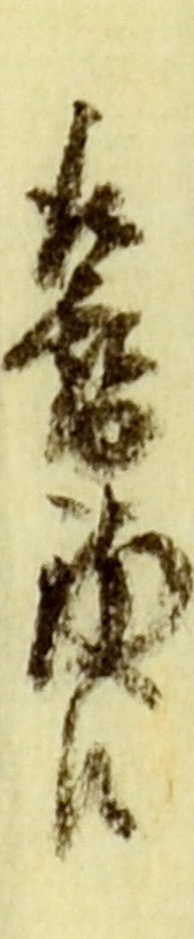取替致候
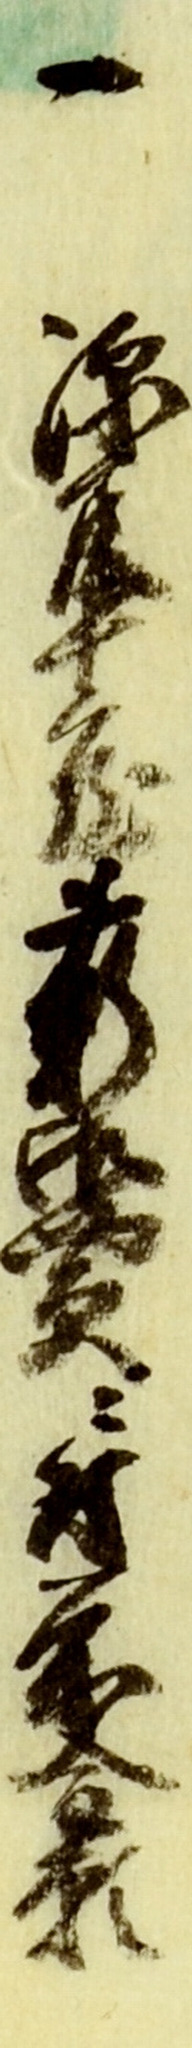一源屋十蔵薪御買ニ付前金願
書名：諸事御用留
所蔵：伊那市立高遠町図書館・合同会社AMANE
